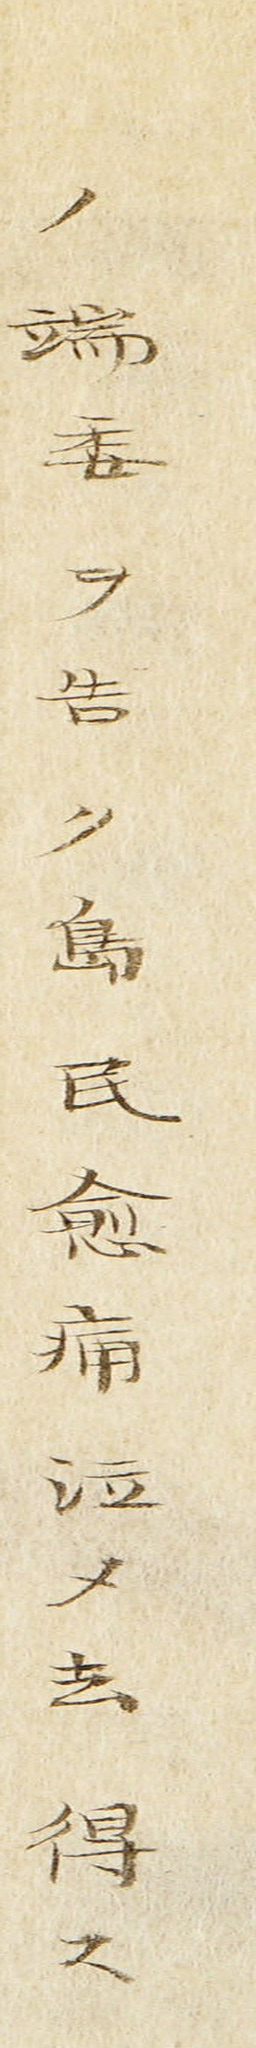ノ端委ヲ告ク島民愈痛泣シテ去得ス
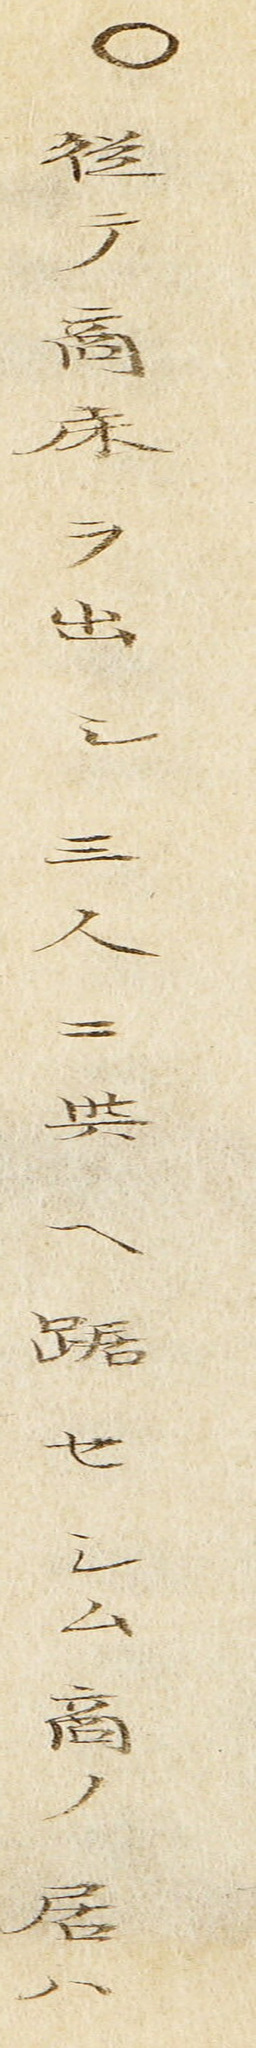○従テ商床ヲ出シ三人ニ与ヘ踞セシム商ノ居ハ
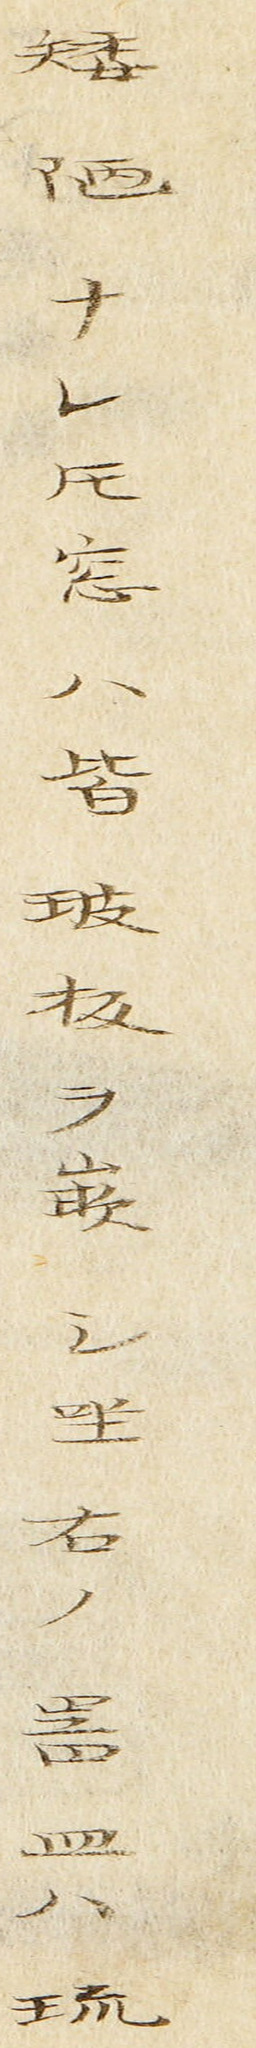矮陋ナレトモ窓ハ皆玻板ヲ嵌シ坐右ノ器皿ハ琉
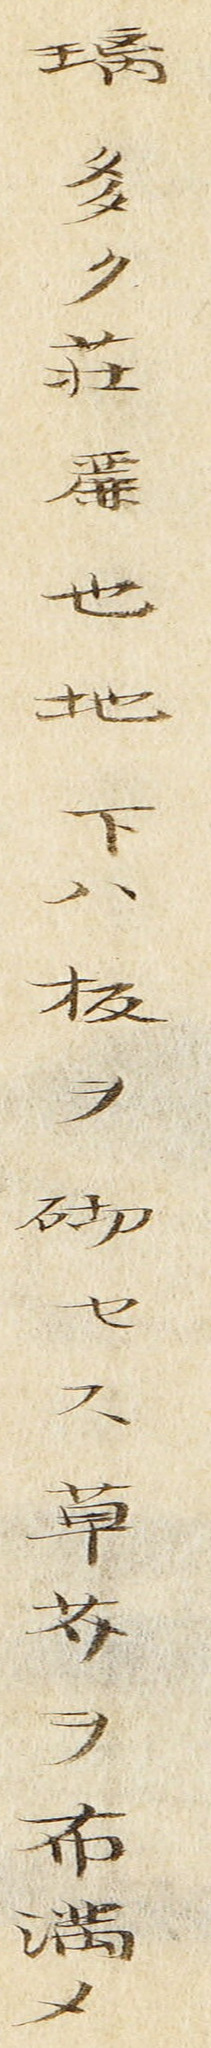璃多ク荘麗也地下ハ板ヲ砌セス草芥ヲ布満シテ
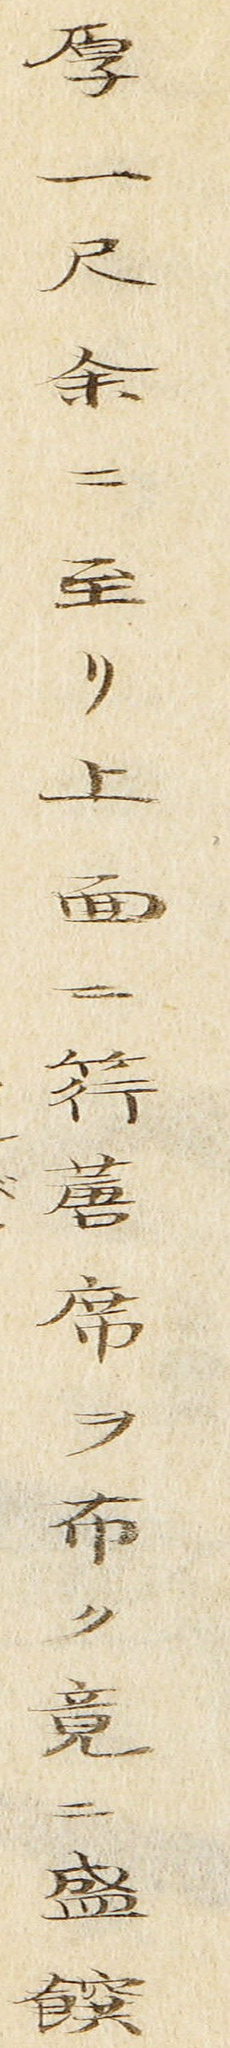厚一尺余ニ至リ上面ニ筕蓎席ヲ布ク竟ニ盛
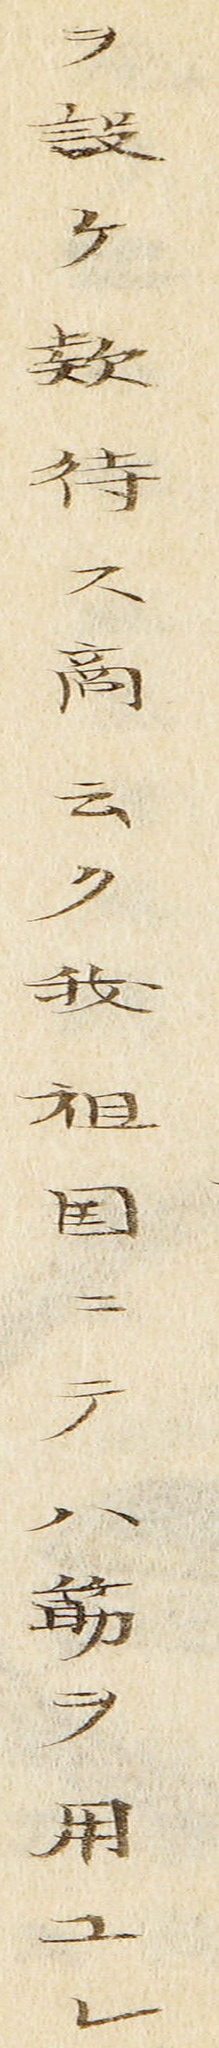ヲ設ケ款待ス商云ク我祖国ニテハ筯ヲ用ユレ
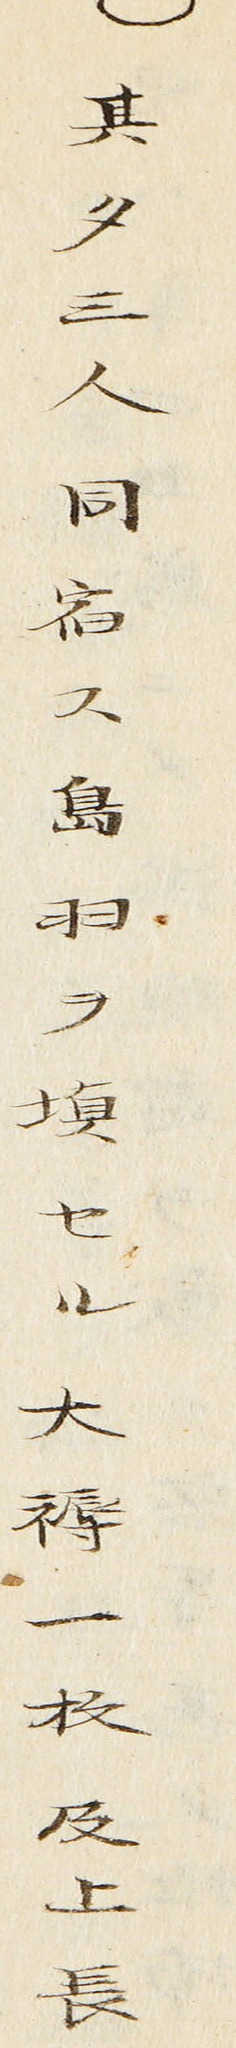○其夕三人同宿ス島羽ヲ填セル大褥一枚及上長
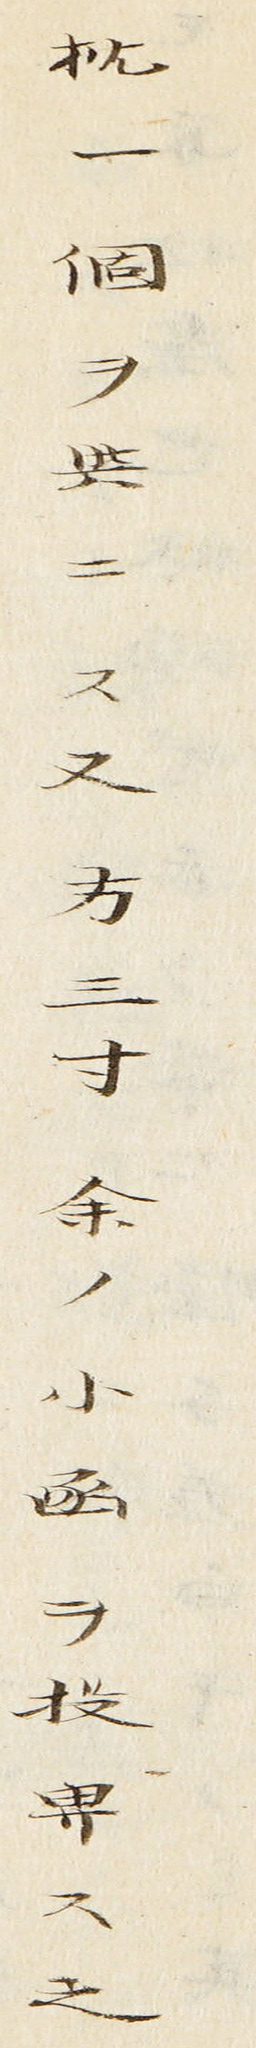枕一個ヲ与ニス又方三寸余ノ小函ヲ投ス之
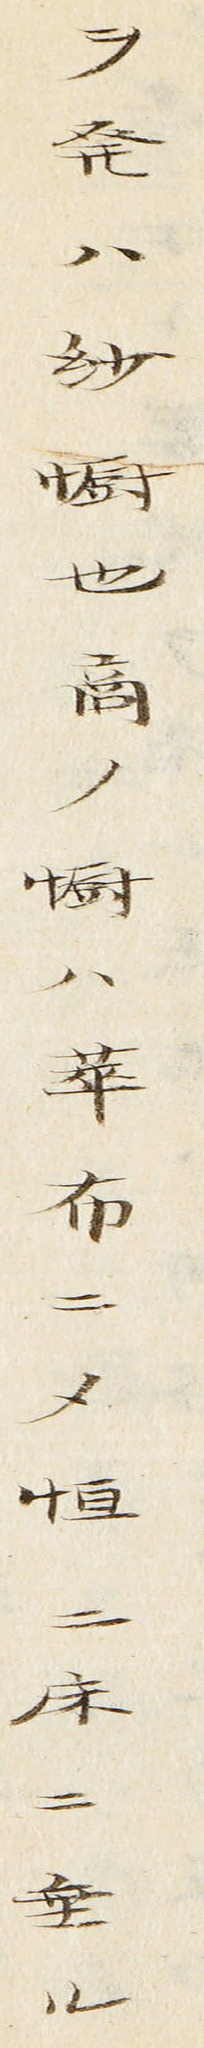ヲ発ハ紗㡡也商ノ㡡ハ萃布ニシテ恒ニ床ニ垂ル
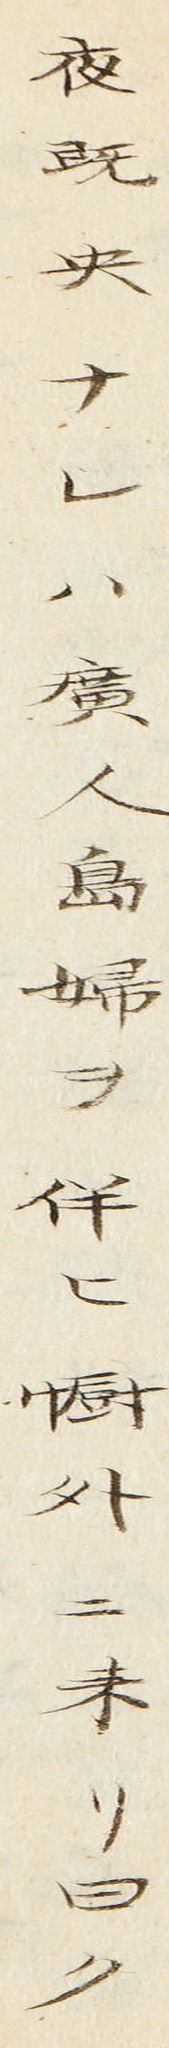夜既央ナレハ広人島婦ヲ伴ヒ㡡外ニ来リ曰ク
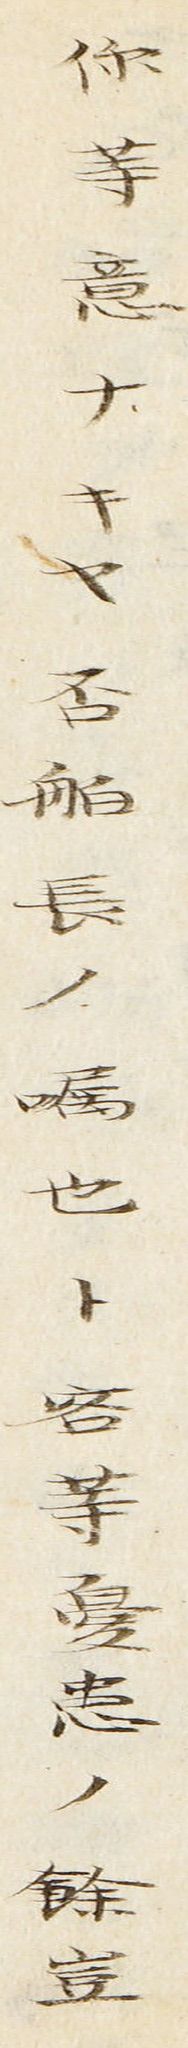你等意ナキヤ否舶長ノ嘱也ト客等憂患ノ余豈
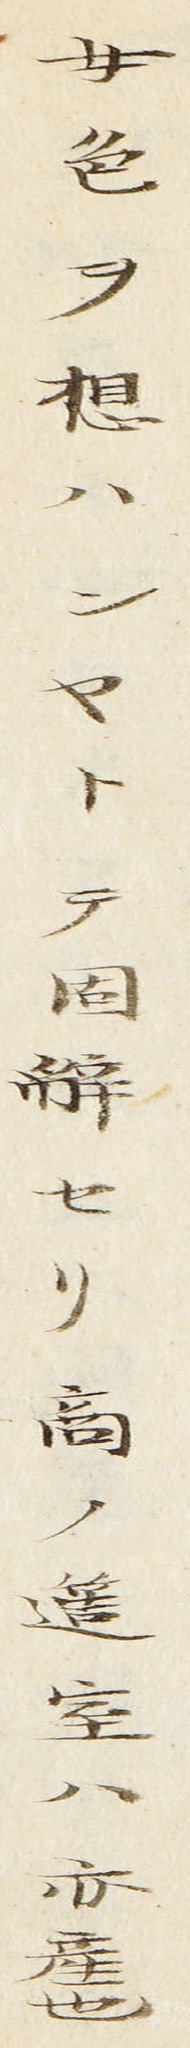女色ヲ想ハンヤトテ固辞セリ商ノ簉室ハ亦産也
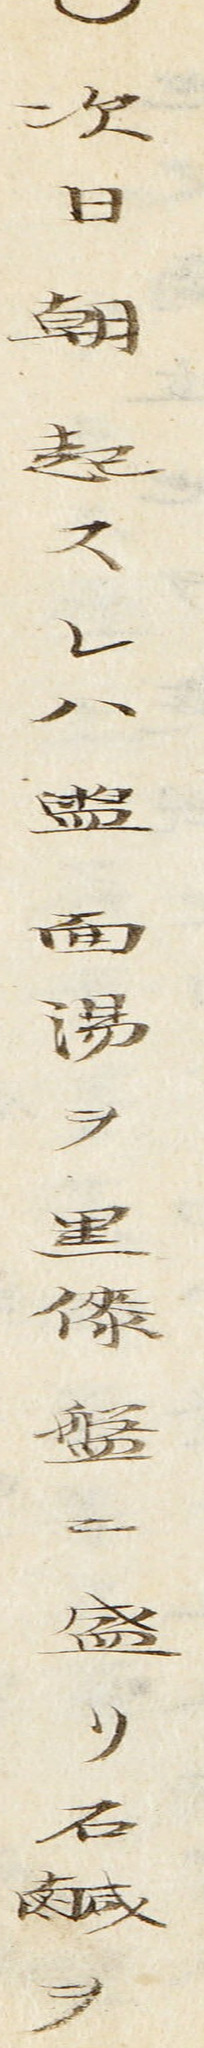○次日朝起スレハ盥面湯ヲ黒盤ニ盛リ石鹹ヲ
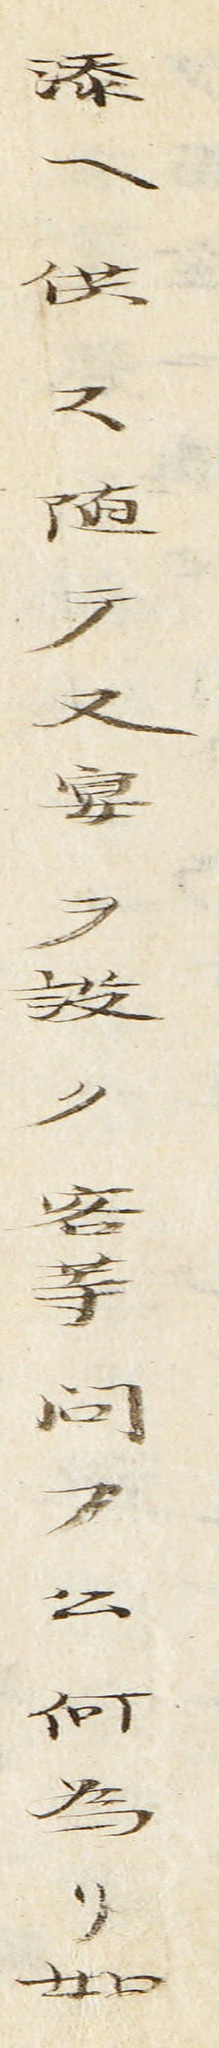添ヘ供ス随テ又宴ヲ設ク客等問フ公何為リ如
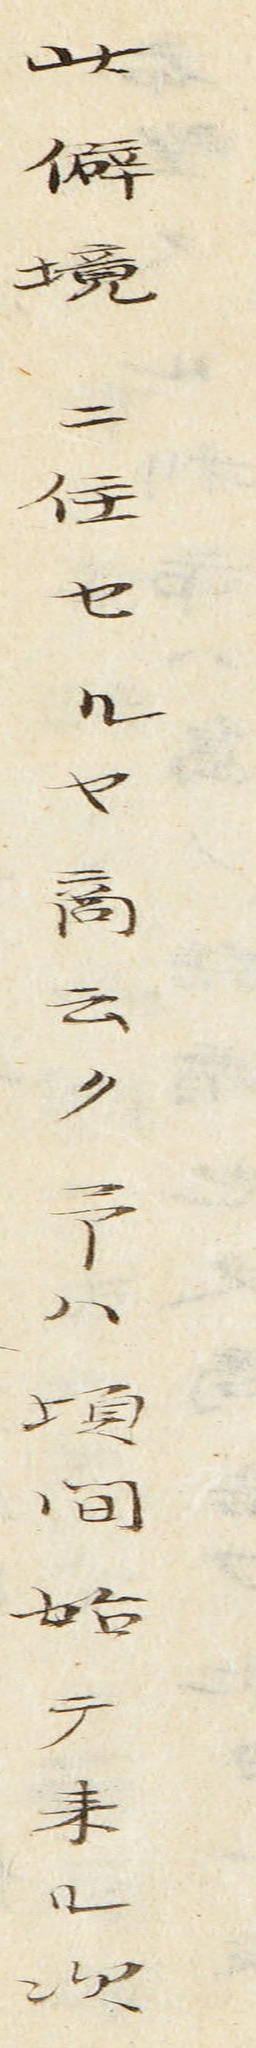此僻境ニ住セルヤ商云ク予ハ頃間始テ来ル次
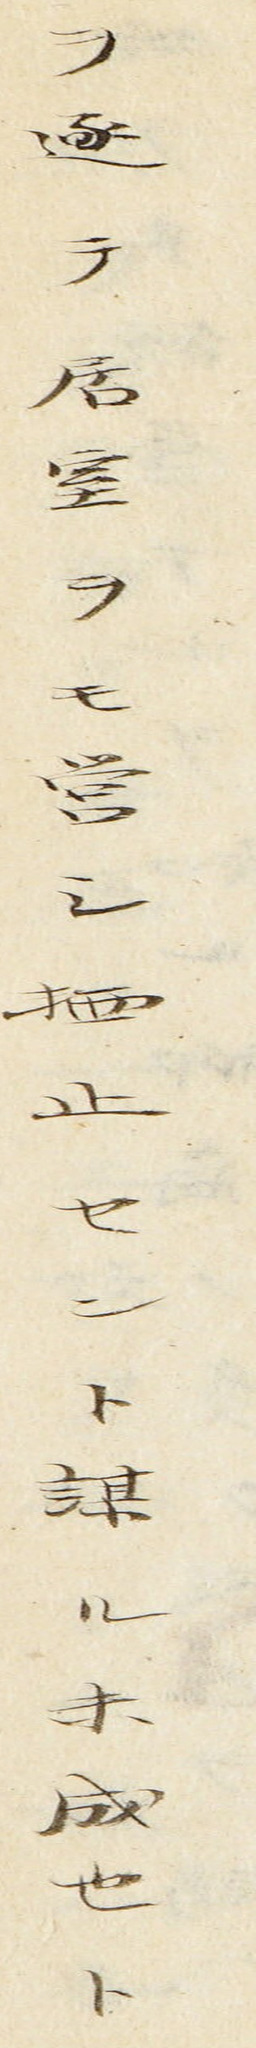ヲテ居室ヲモ営シ拪止セント謀ル未成也ト
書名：流蕃通書
